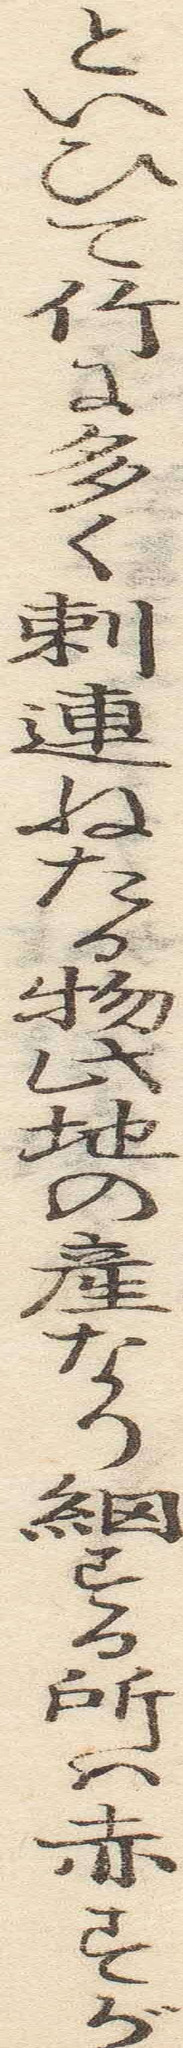といひて竹に多く刺連ねたる物此地の産なり網する所は赤すが
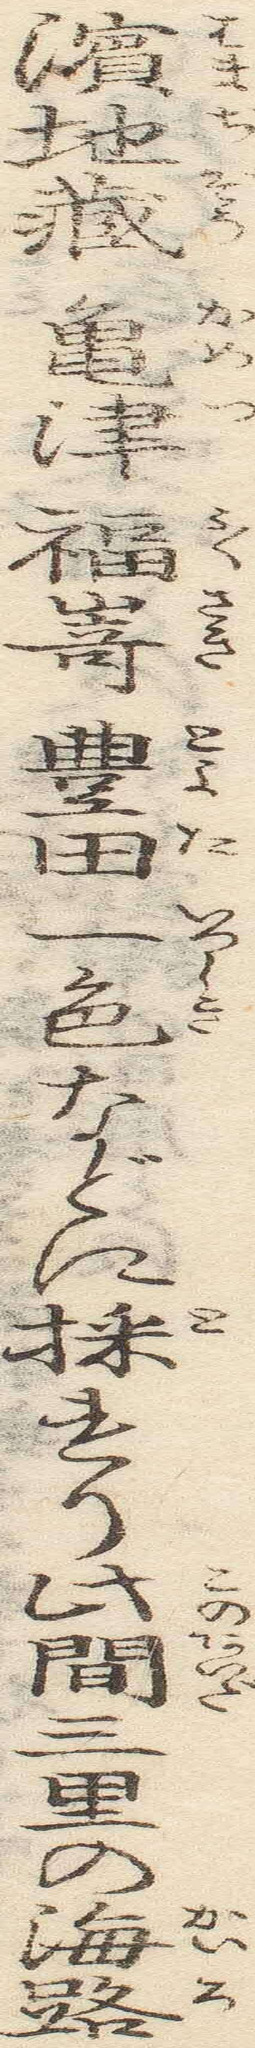浜地蔵亀津福崎豊田一色などに採れり此間三里の海路
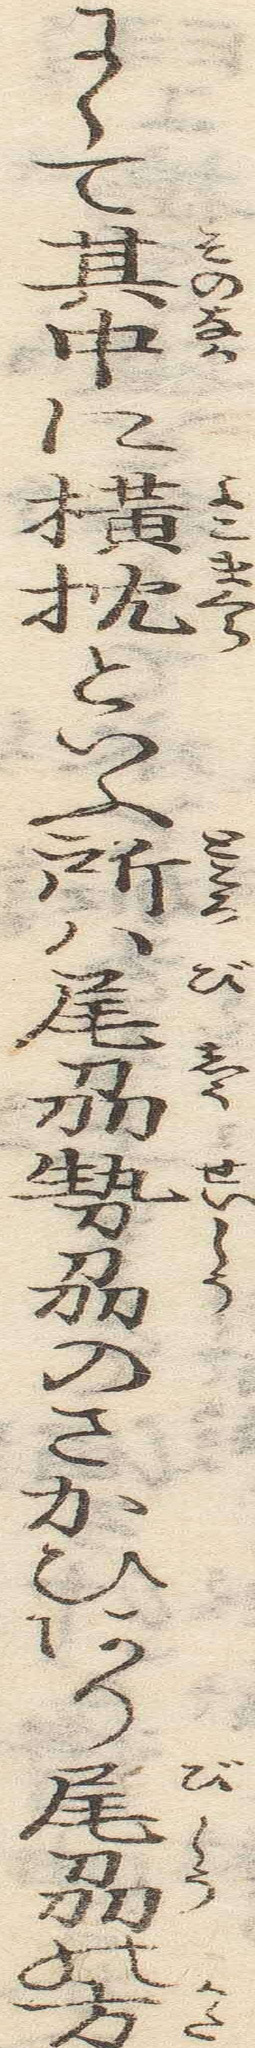にして其中横枕といふ所は尾州勢州のさかひあり尾州の方
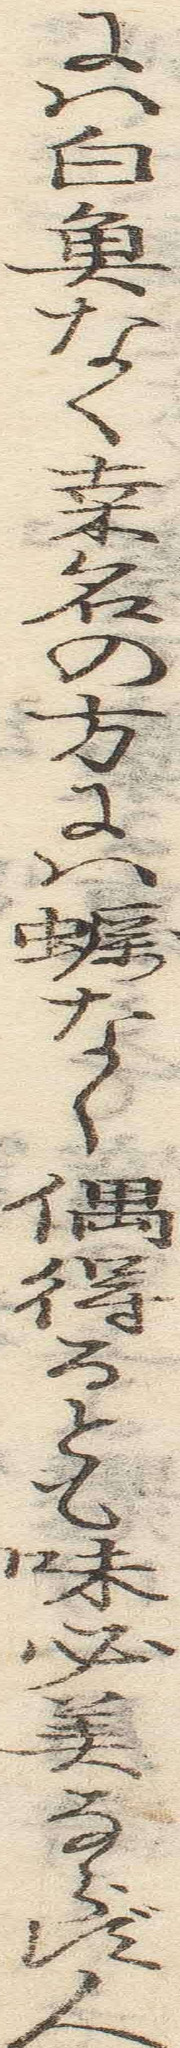には白魚なく桑名には蠣なし偶得るとも味必美ならず人
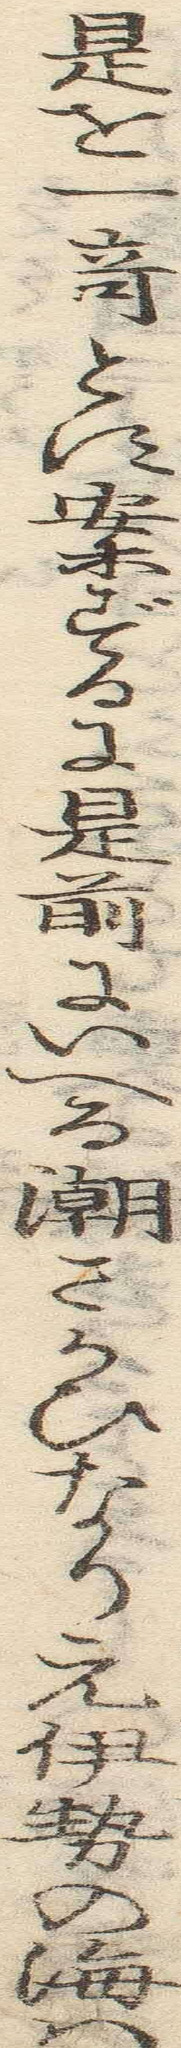是を一奇とす案ずるに是前にいへる潮さかひなり元伊勢の海は
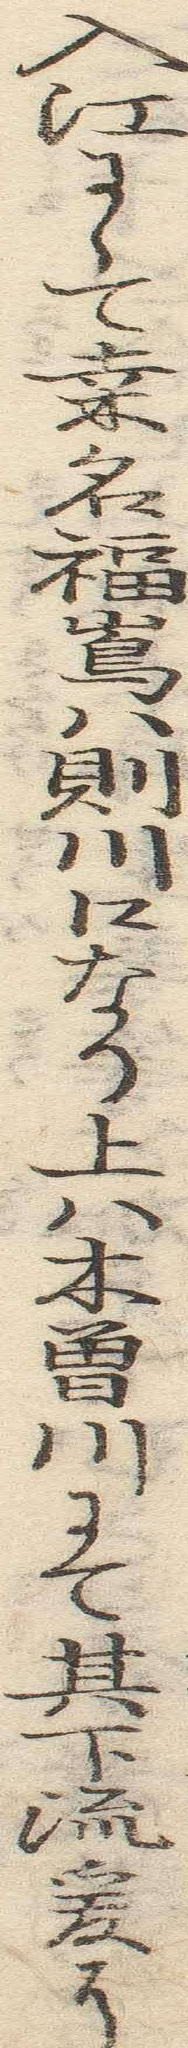入江にして桑名福島は則川口なり上は木曽川にて其下流爰に
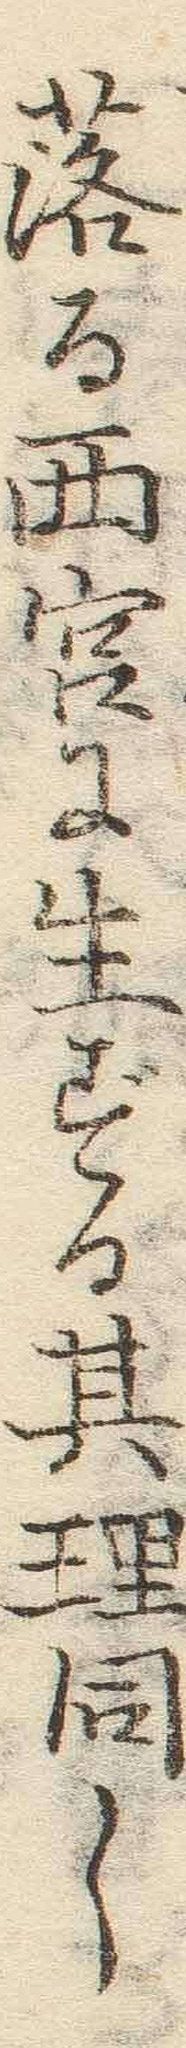落る西宮に生ずる其理同し
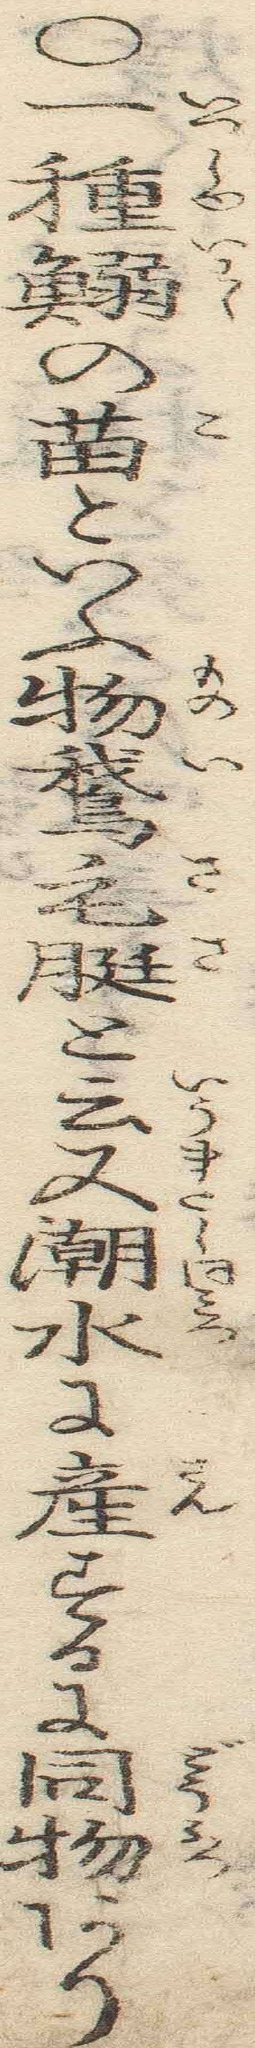○一種鰯の苗といふ物鵞毛脡と云又潮水に産するに同物あり
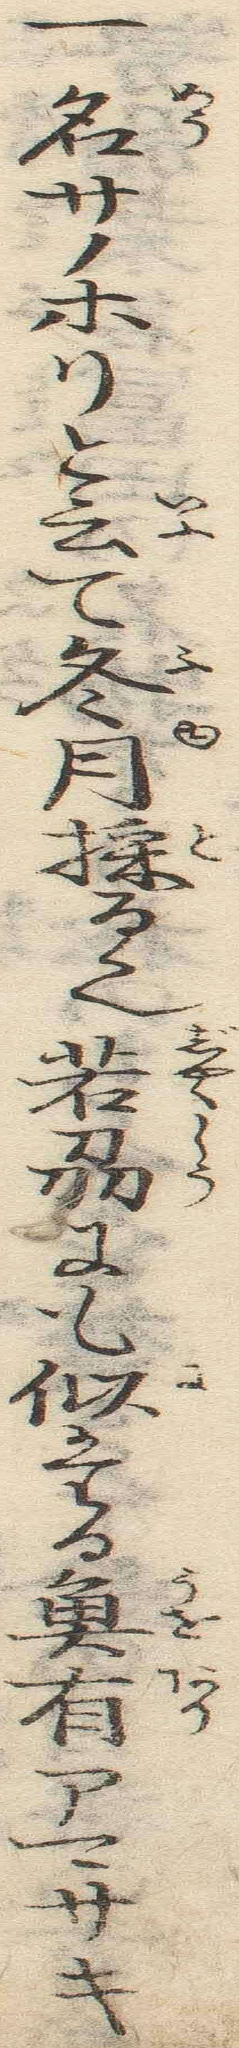一名サノホリと云て冬月採る也若州にも似たる魚有アマサキ
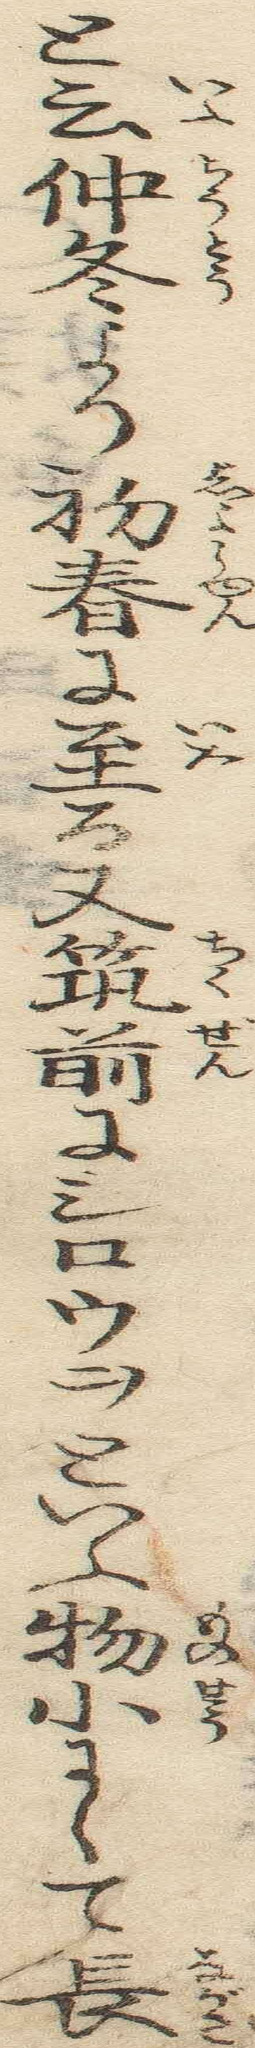と云仲冬より初春に至る又筑前にシロウヲといふ物小にして長
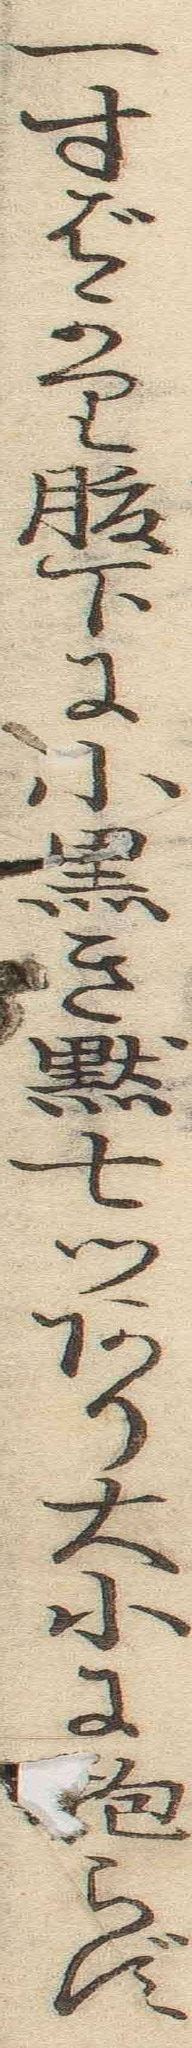一寸ばかり腹下に小黒き黙七ッあり大小に拘らず

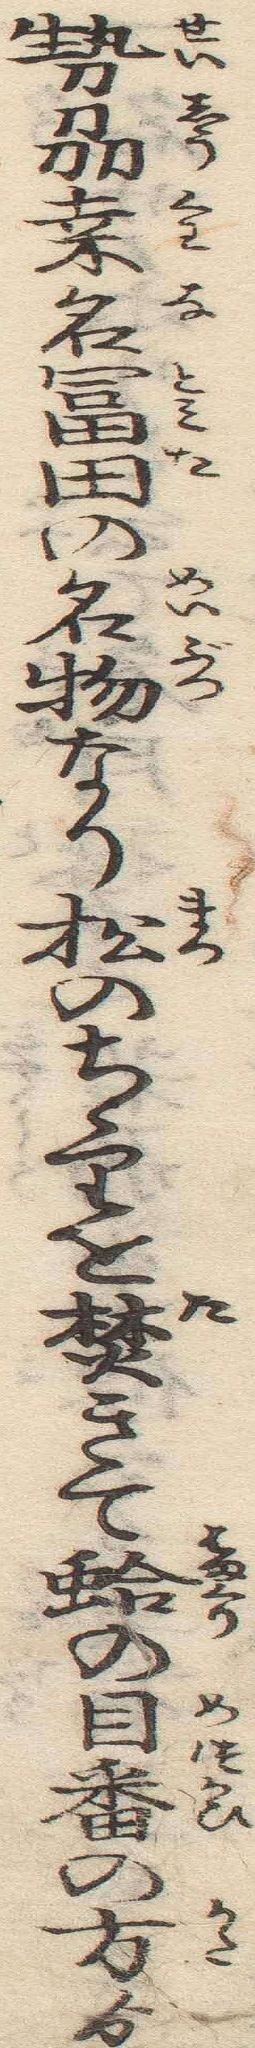勢州桑名富田の名物なり松のちゝりを焚きて蛤の目番の方より
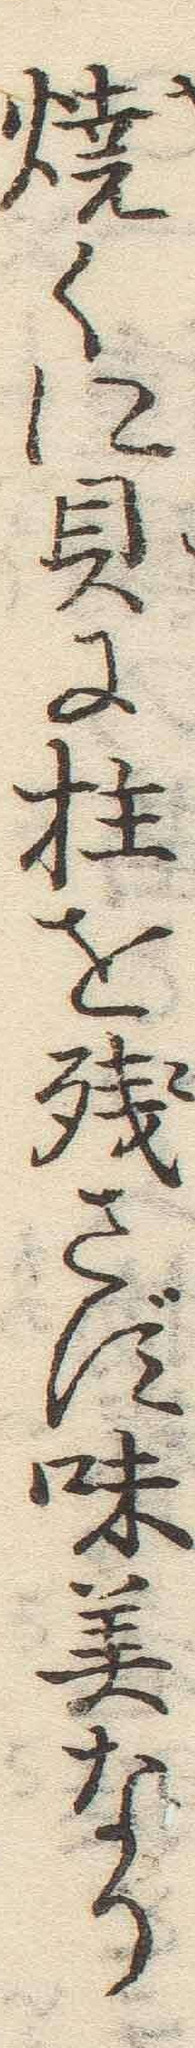焼くに貝に柱を残さず味美なり
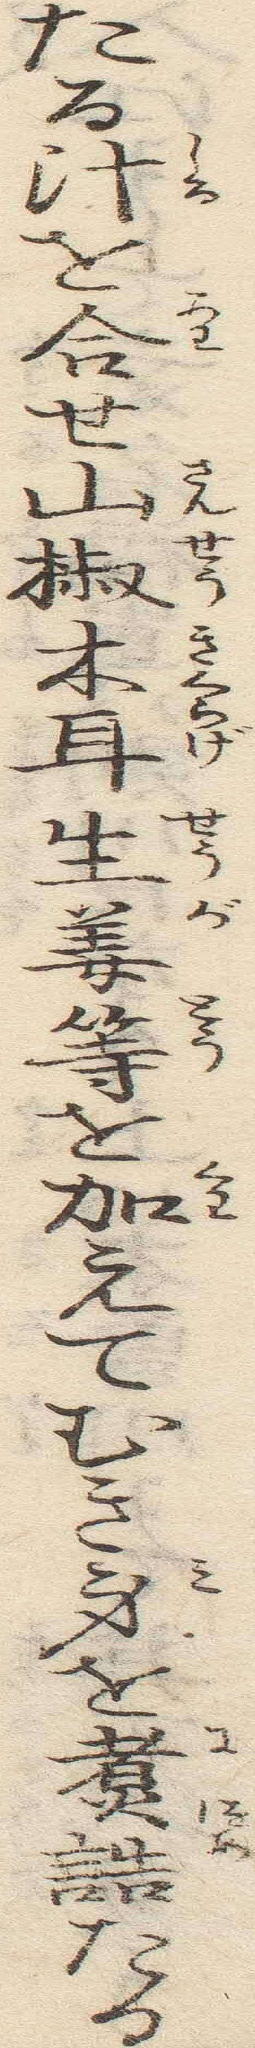たる汁を合せ山椒木耳生姜等を加えてむき身を煮詰たる
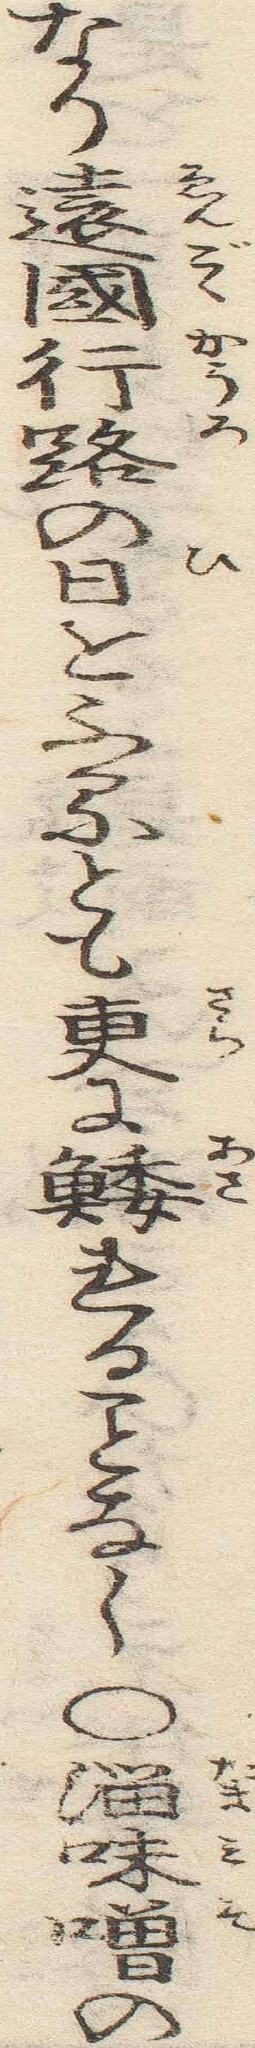なり遠国行路の日をふるとも更に鯘れることなし○溜味噌の
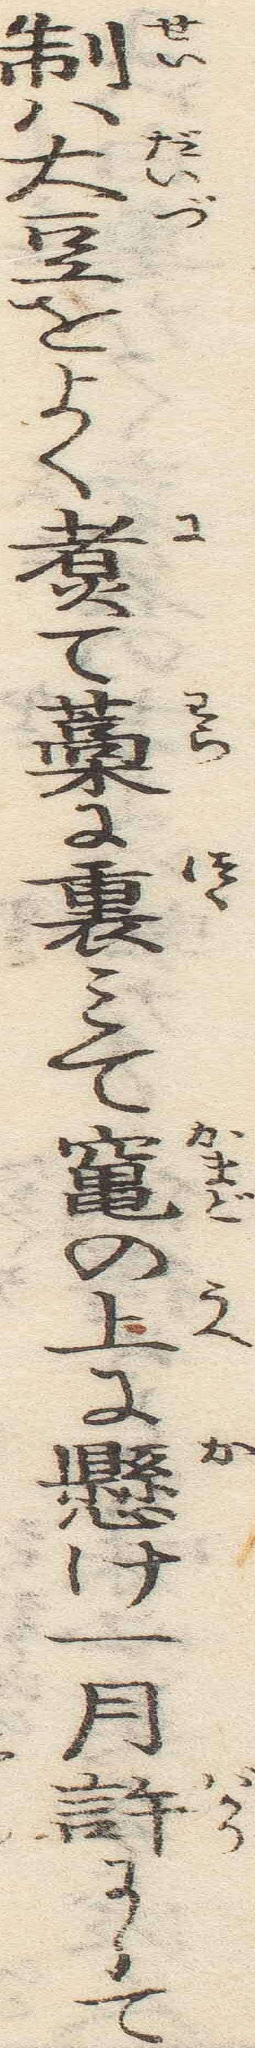制は大豆をよく煮て藁に裹みて竃の上に懸け一月許にして
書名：日本山海名産図会
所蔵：東京学芸大学附属図書館 国文学研究資料館
